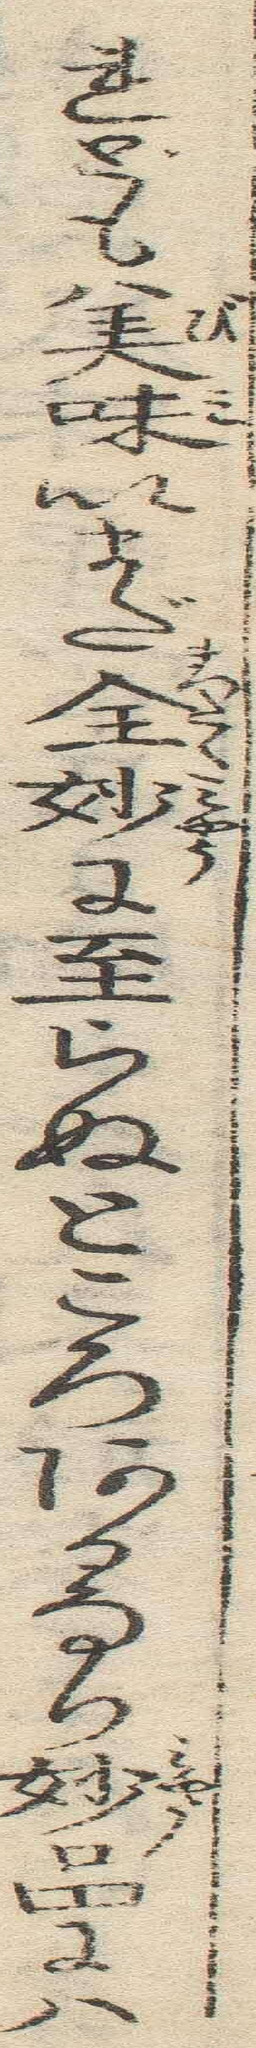れとも美味いまだ全妙に至らぬところあるなり妙品には
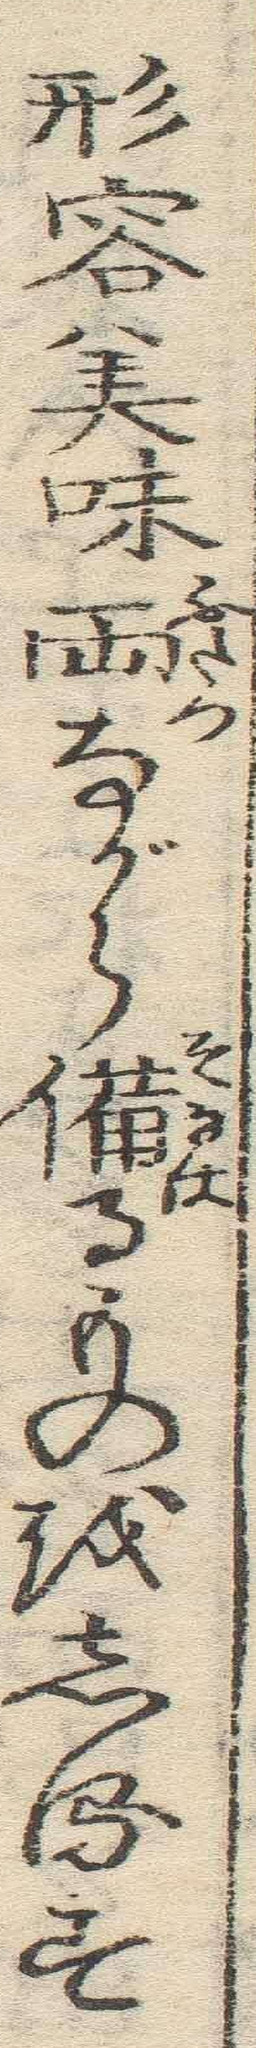形容美味両ながら備るものをしるす
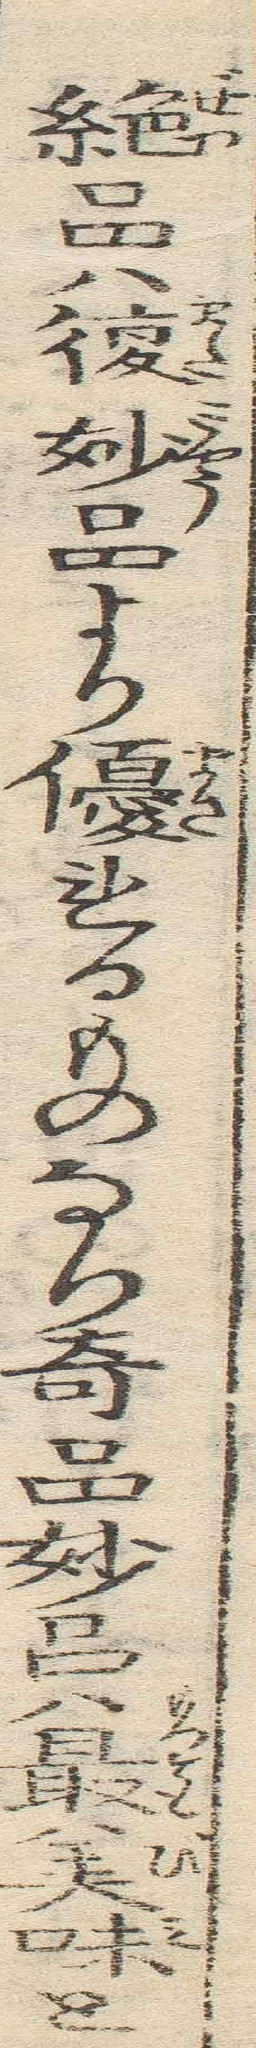一絶品は復妙品より優れるものなり奇品妙品は最美味と
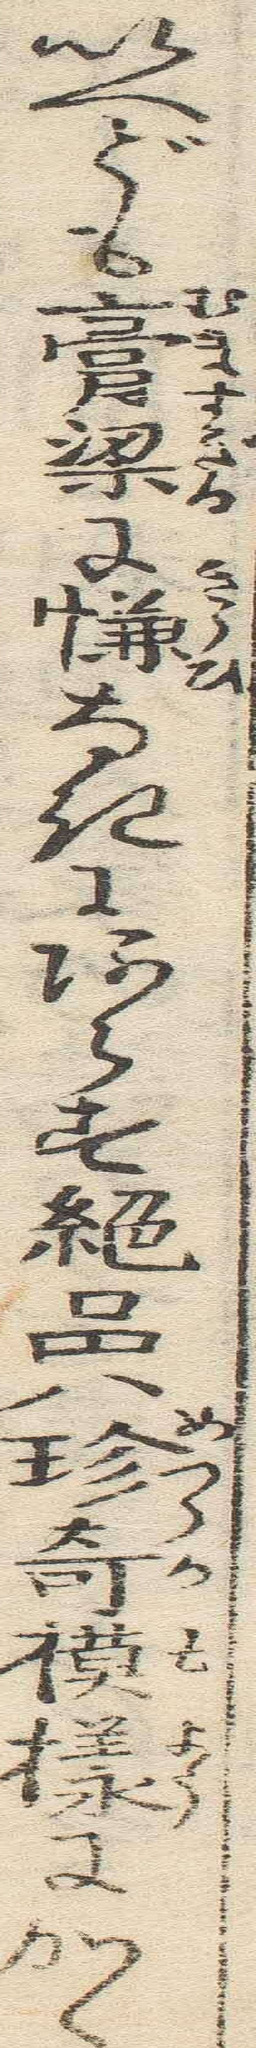いへども膏梁に慊なきにあらす絶品は珍奇模様にかゝ
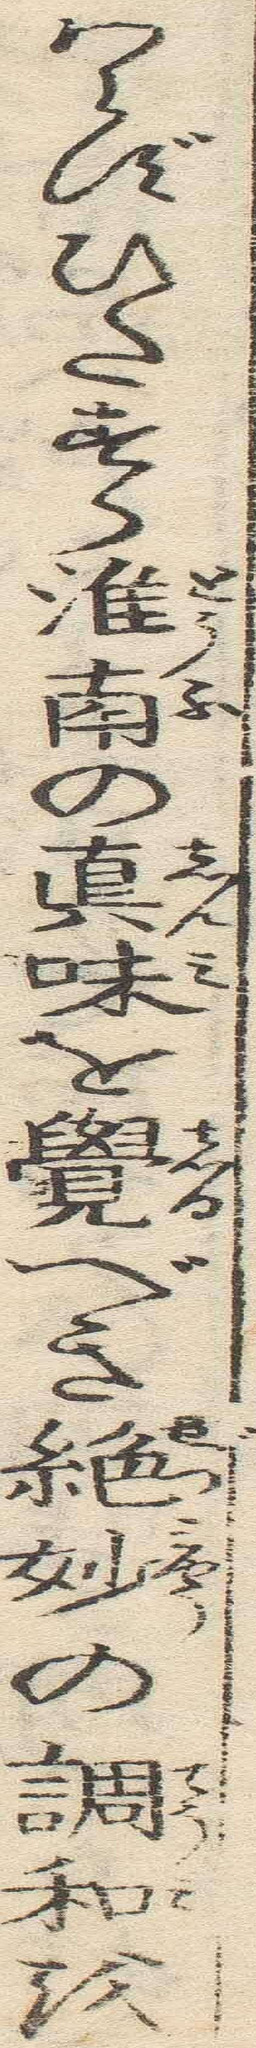はらずひたすら淮南の真味を覚べき絶妙の調和を
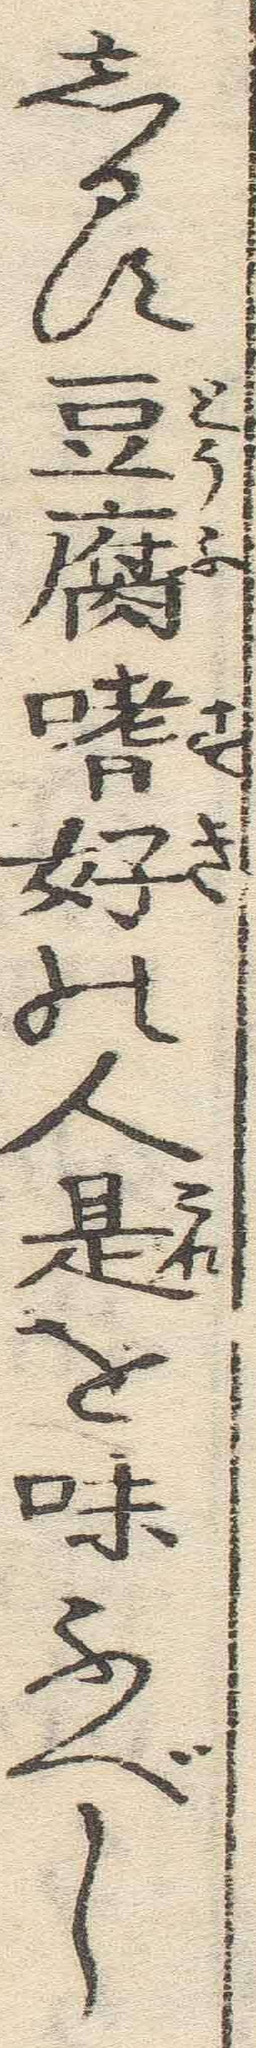しるす豆腐嗜好の人是を味ふべし
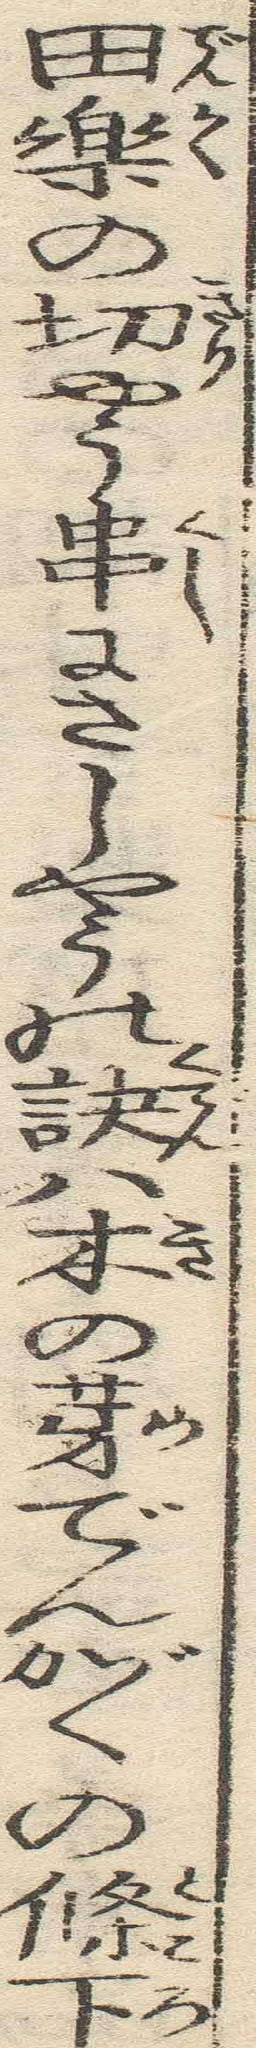一田楽の切やう串にさしやうの訣は木の芽でんがくの條下
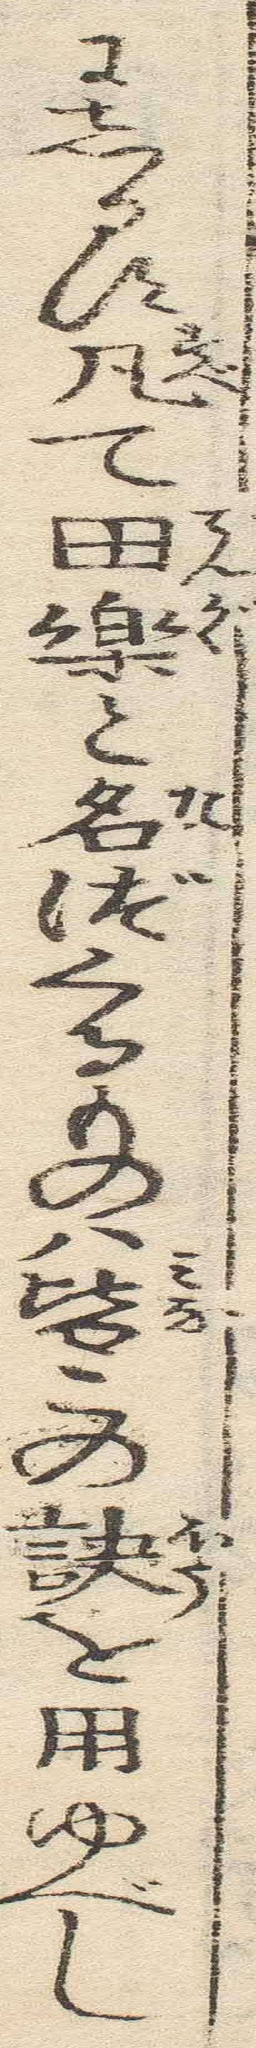にしるす凡て田楽と名づくるものは皆この訣を用ゆべし
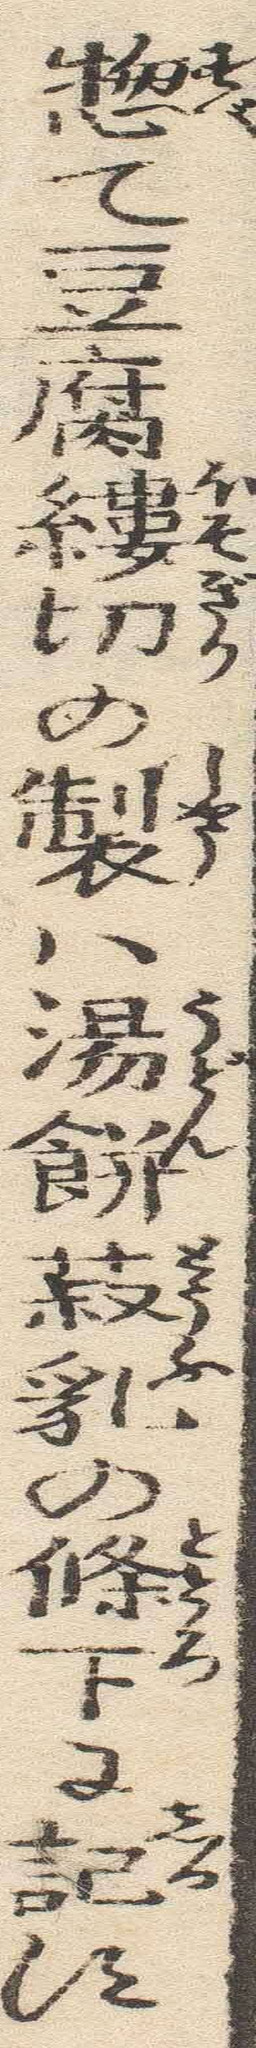一惣て豆腐縷切の製は湯餅菽乳の條下に記す
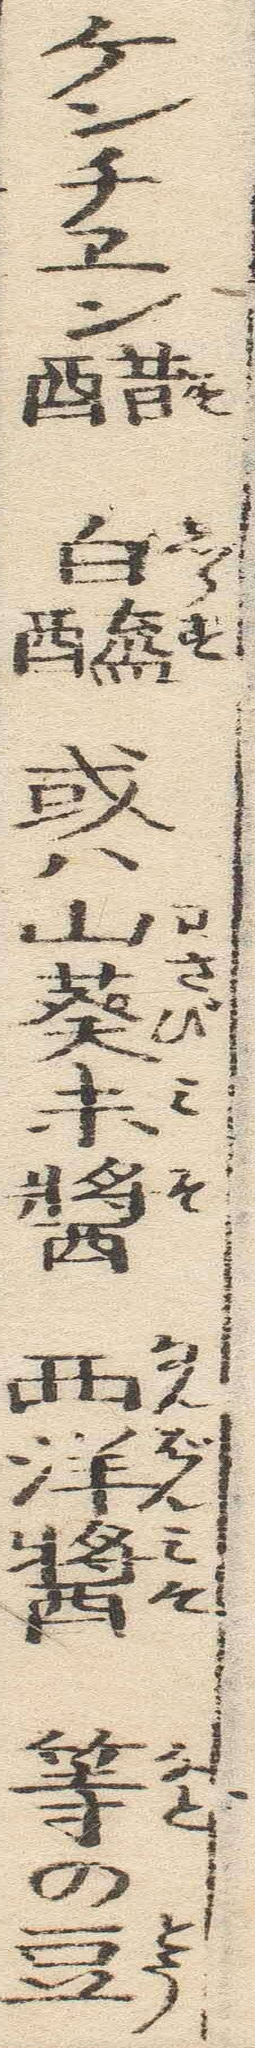一ケンチヱン醋白醯或は山葵未醤西洋醬等の豆
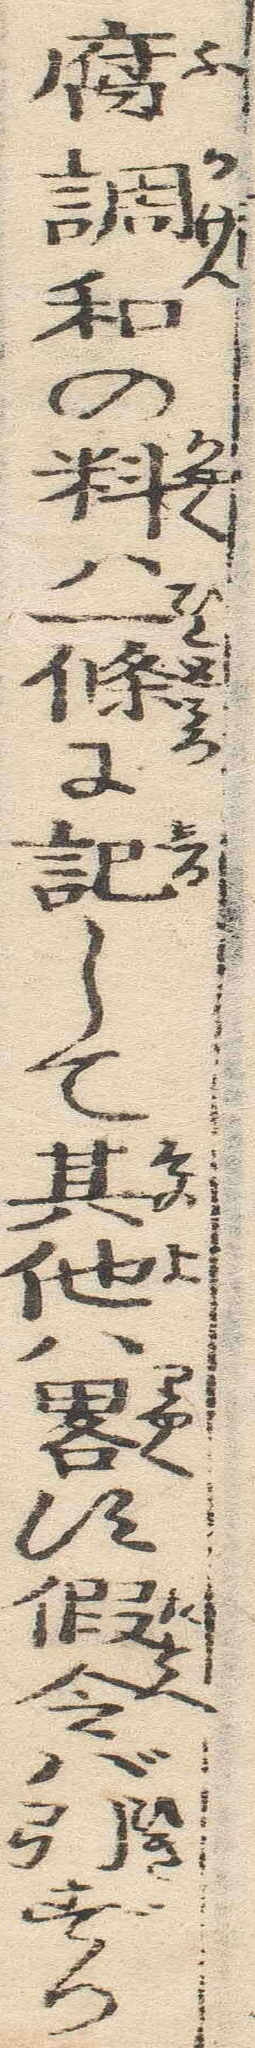腐調和の料は一條に記して其他は略す仮令ば引ずり
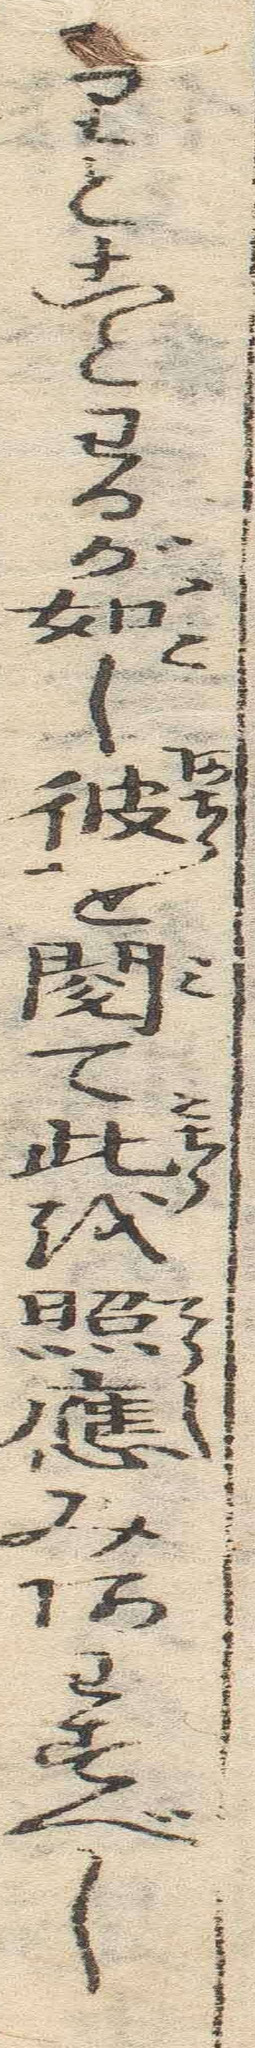りとことわるが如し彼を閲て此を照応みあわすべし
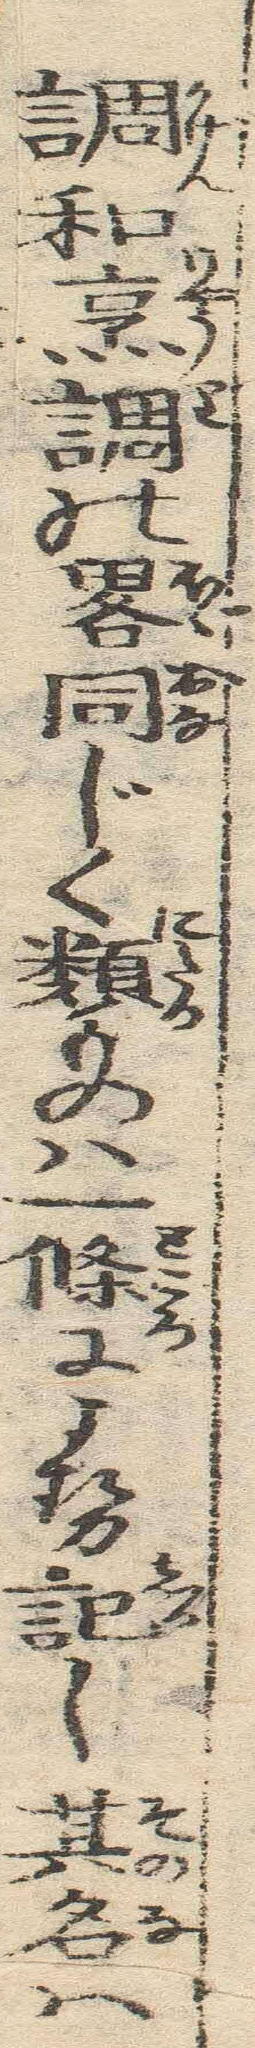一調和烹調の略同じく類のものは一條によせ記し其名は
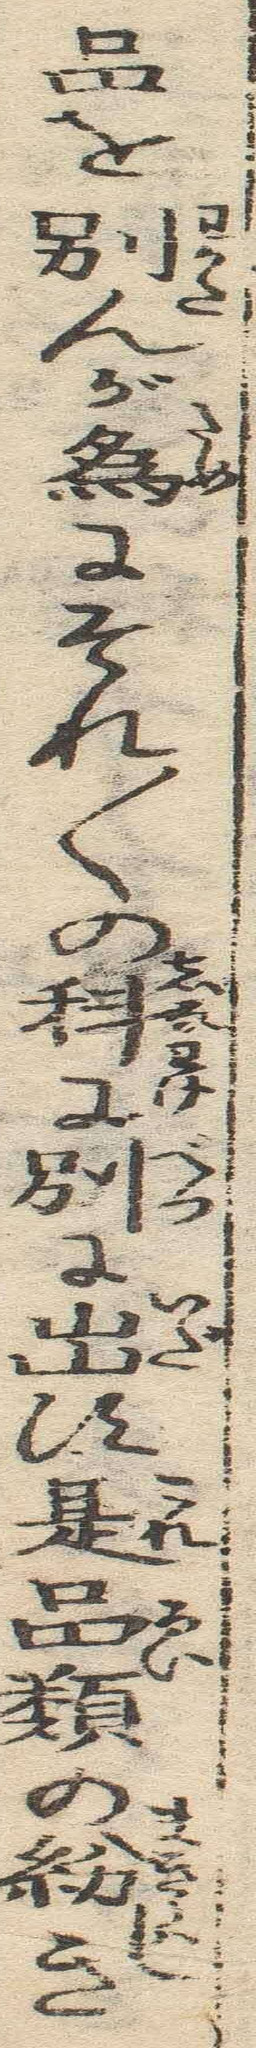品を別んが為にそれ〳〵の科に別に出す是品類の紛き
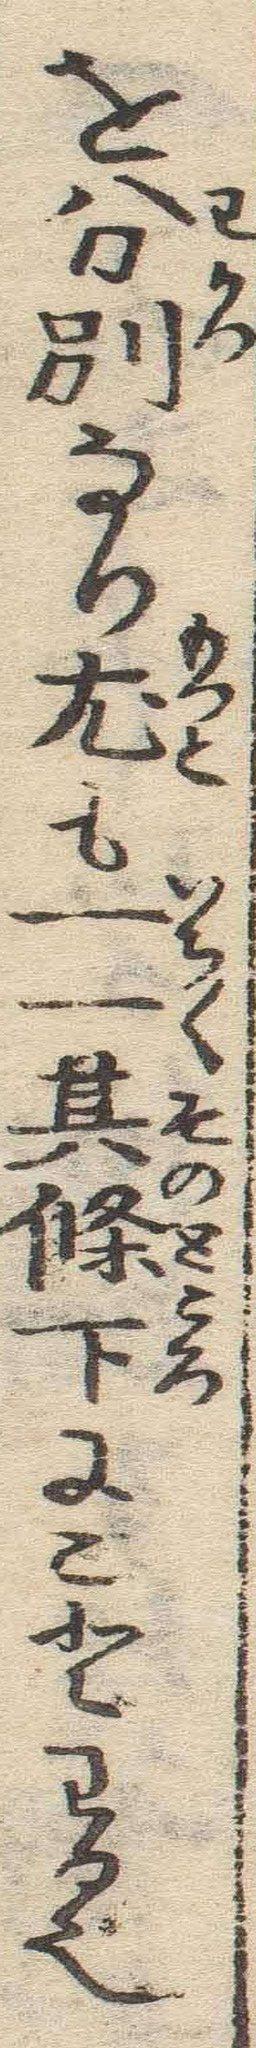を分別なり尤も一一其條下にことわる也
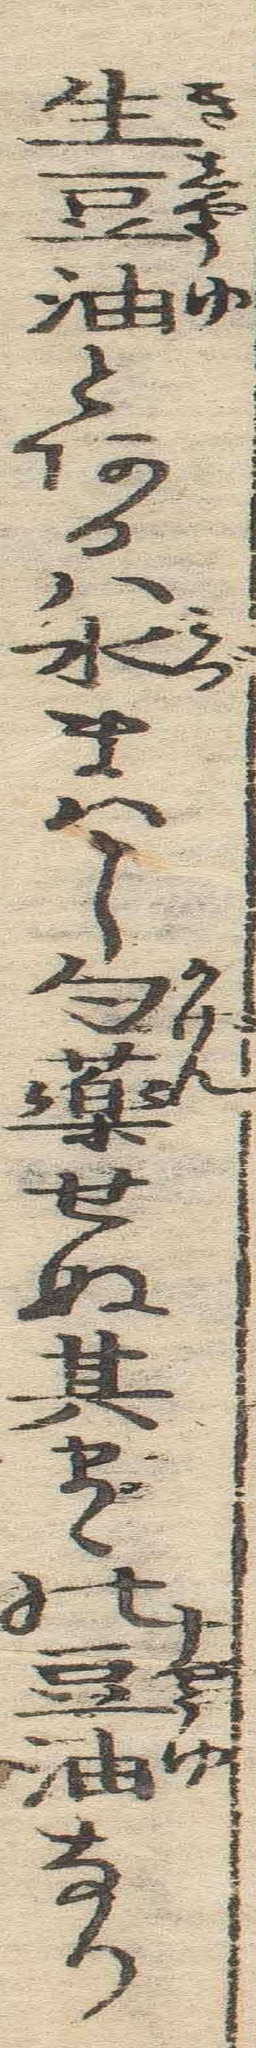一生豆油とあるは水まはし勺薬せぬ其まゝの豆油なり
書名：豆腐百珍
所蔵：東京学芸大学附属図書館 国文学研究資料館
